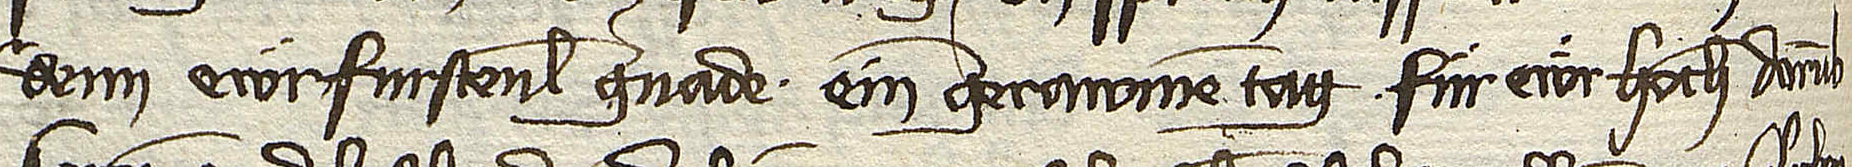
denn ewr furſtenl* gnade . ein gerawme* tag . für ewr* hoch* darub*
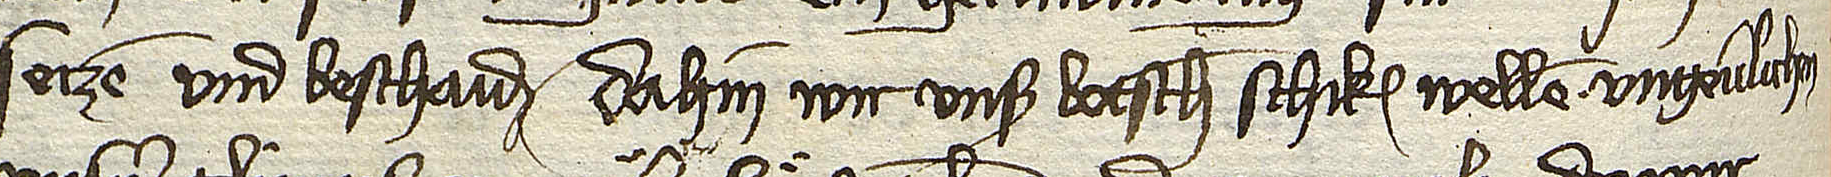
ſecʒe* vnd beſchaid* / dahin wir vnſ* botſch* ſchik* welle* . vngeu*lichen
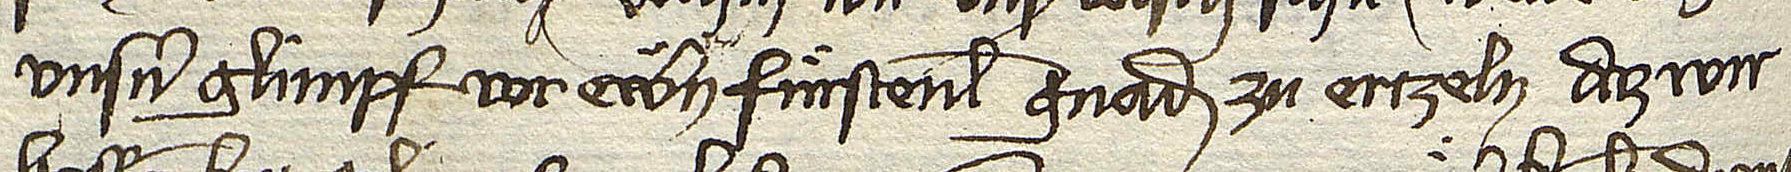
vnſ*n glimpf vor ew*n fürſtenl* gnad* ʒu ercʒeln daʒ wir
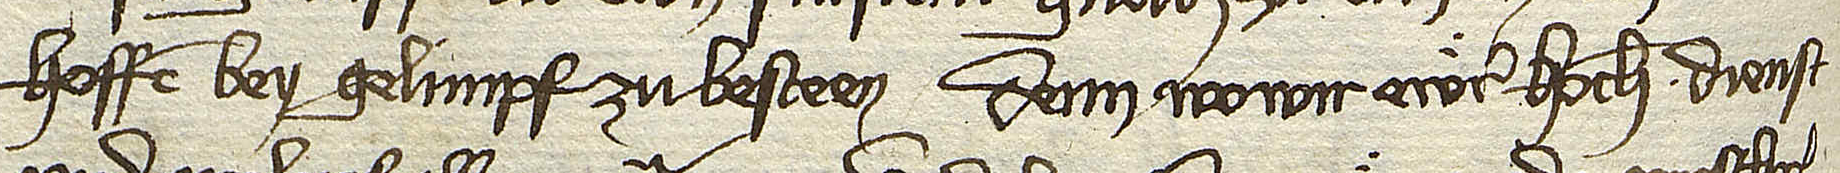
hoffe* bey gelimpf ʒu beſteen / Denn wo wir ewr* hoch* . dienſt
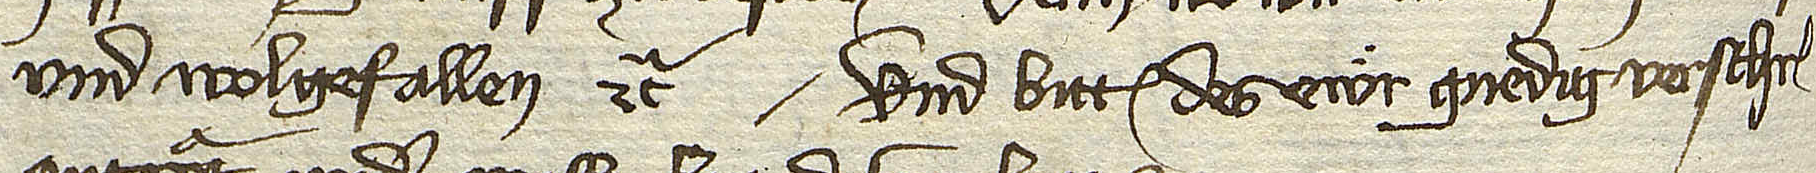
vnd wolgefallen ec* / Vnd bitt* des ewr gnedig verſchr*
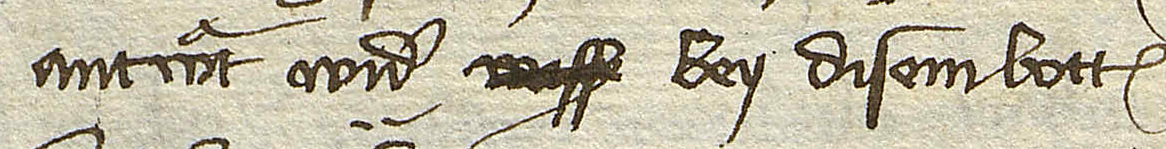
antw*t wid* wiſſ bey diſem bott*
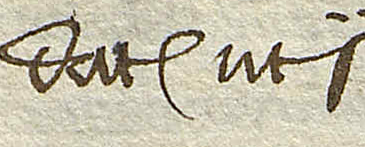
Dat* ut ſ*
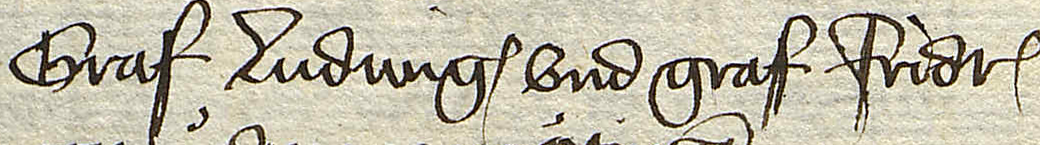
Graf Ludwig* vnd graf Fridr*
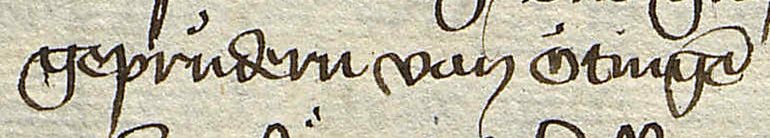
geprüdern von Ötinge*
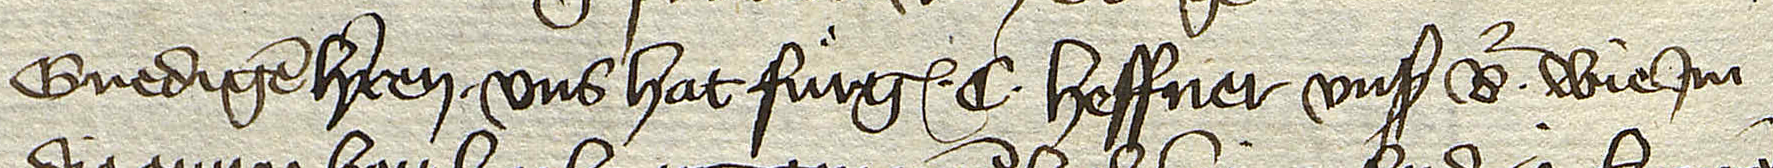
Gnedige* h*ren / vns hat fürg* . C . heffner vnſ*r B* . wie Im
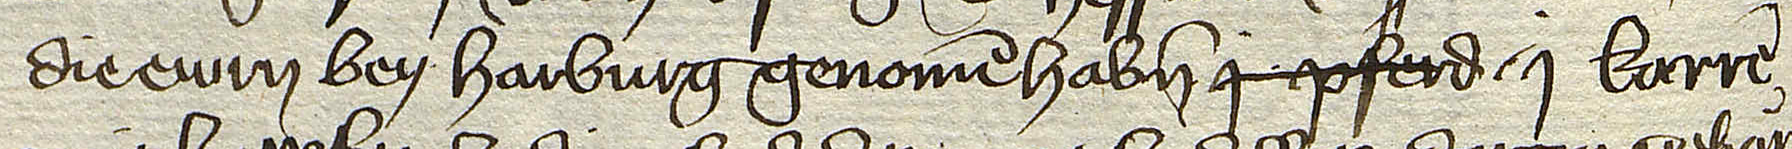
die ewrn bey . harburg genome* hab*n i pferd / i karre*
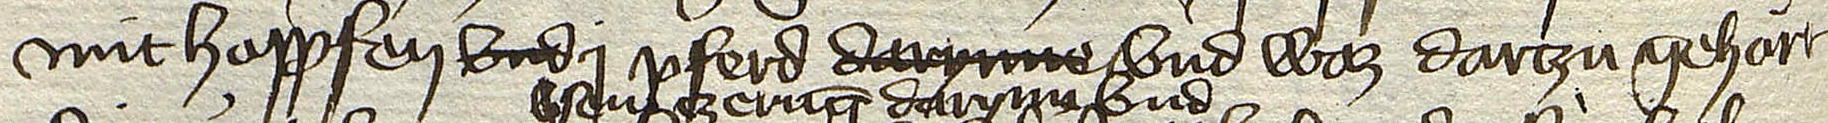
mit hoppfen vnd i pferd darynne vnd waʒ darcʒu gehört
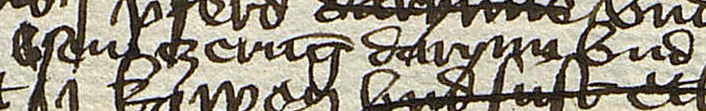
b ſein cʒerug* darynn vnd
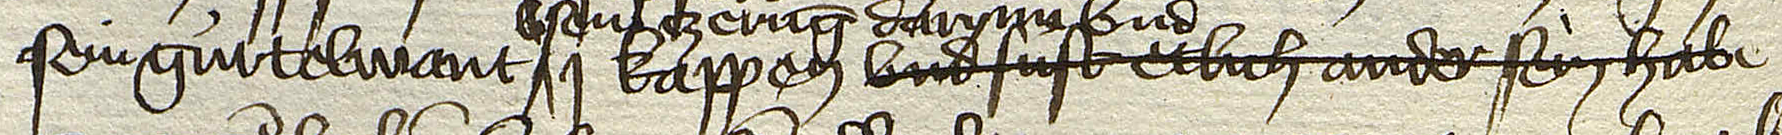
ſein gürtelwant i kappen vnd ſuſt etlich ander ſein habe
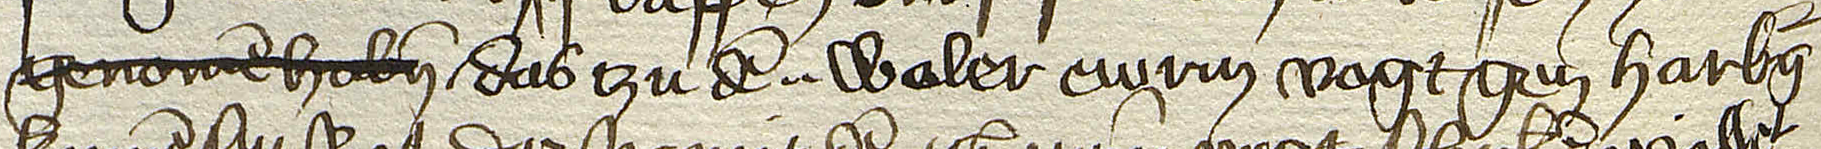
genome* hab*n / das cʒu d* Woler ewrm vogt gen harbg*
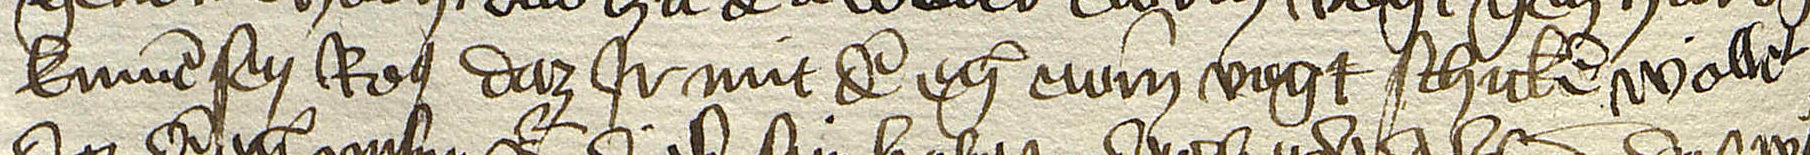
kume* ſey Ro* daʒ Ir mit d* eg* ew*m vogt ſchicke* wöllet
